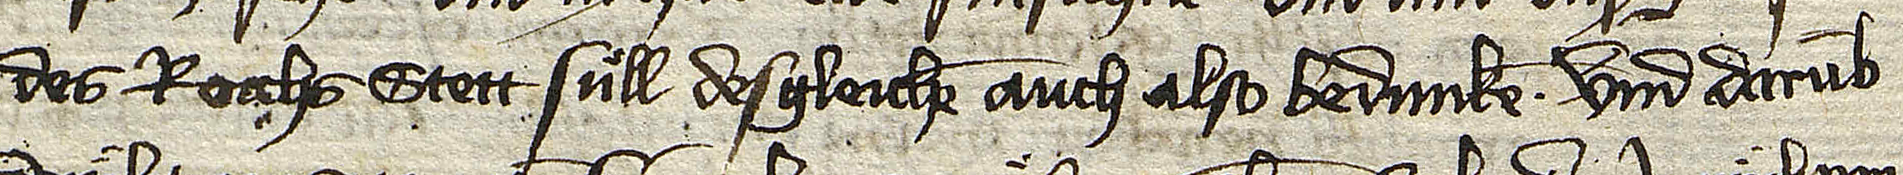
des Reichs Stett ſüll deſgleiche* auch alſo bedunke* . Vnd darub*
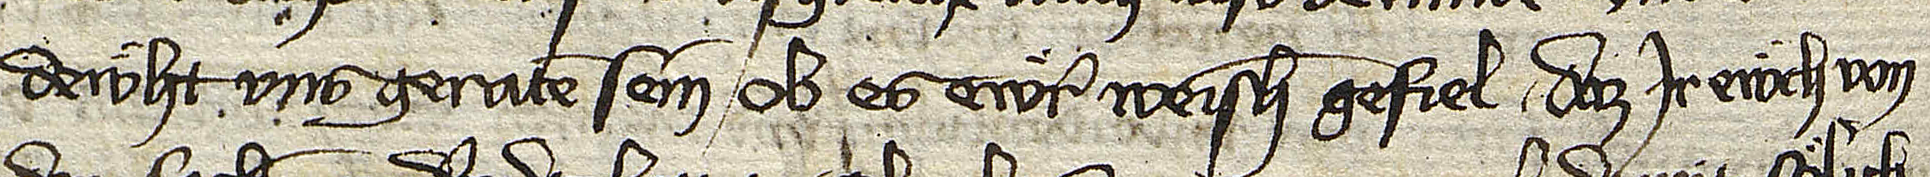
deẅht vns gerate* ſein / ob es eẅr* weiſh* gefiel / Daʒ Ir eẅch von
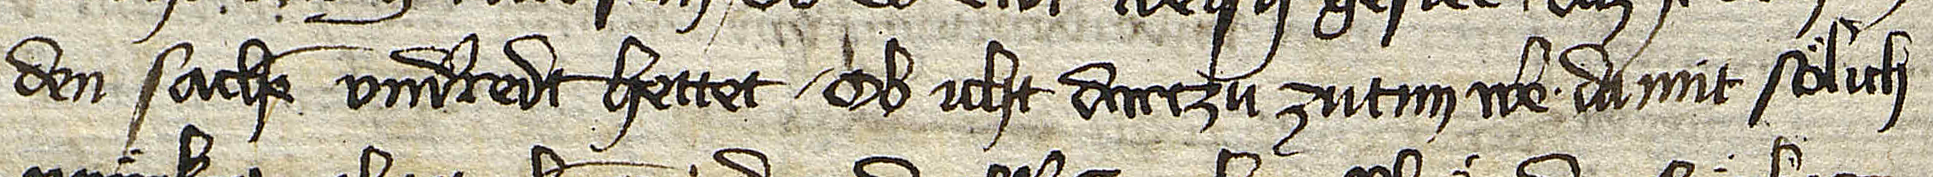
den ſache* vnd*redt hettet / Ob icht darcʒu ʒutun w*e . da mit ſölich
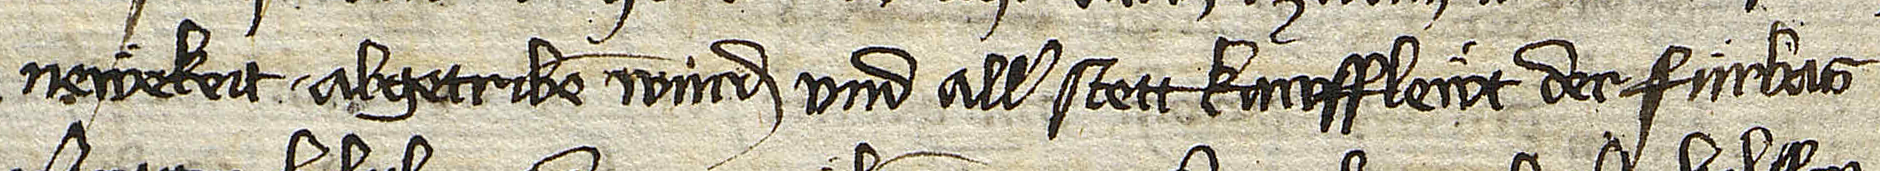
neẅekeit / abgetribe* wurd* vnd all* ſtett kawffleẅt der fürbas
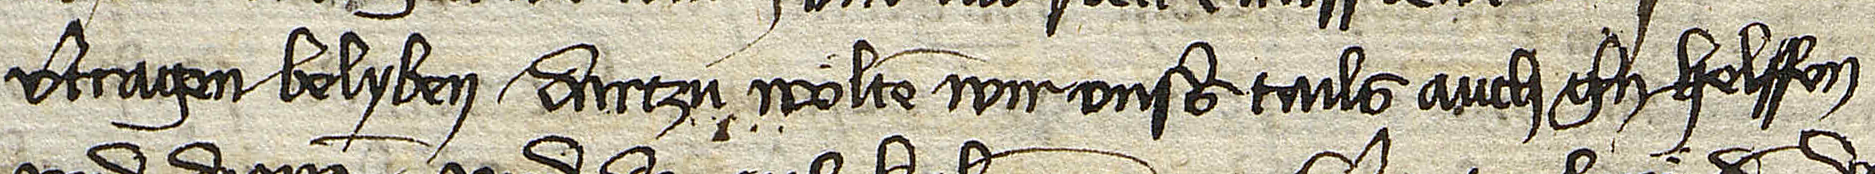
v*tragen belyben / Darcʒu wölte* wir vnſ*s tails auch g*n helffen
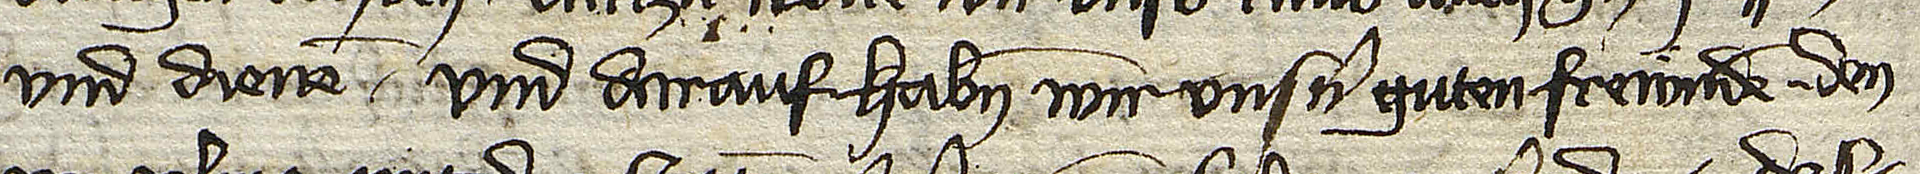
vnd diene* / vnd darauf habn* wir vnſn* guten freẅnde* ~ den
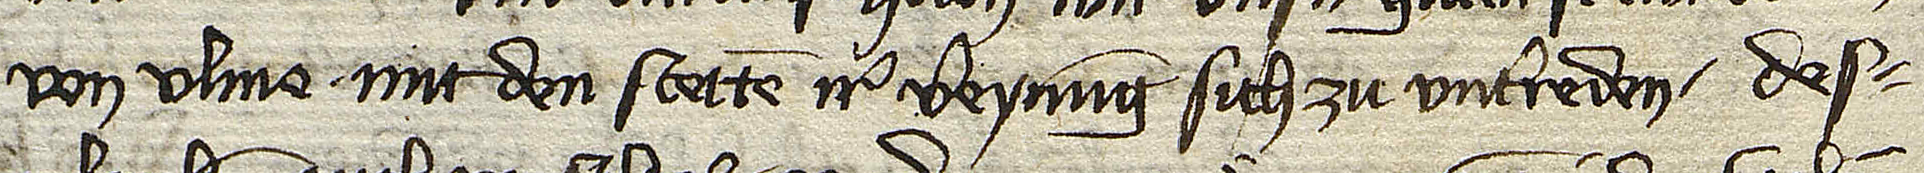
von vlme mit den ſtette* ir* v*eynu*g ſich ʒu vnt*reden / deſ =
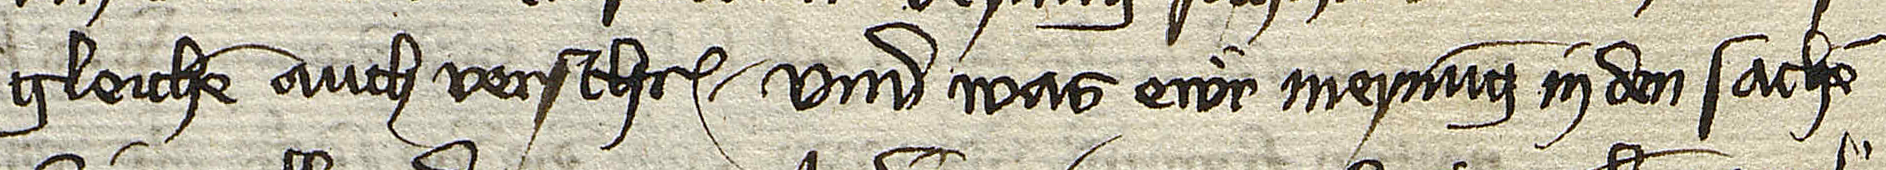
gleiche* auch verſchr* / vnd was eẅr meynu*g in den ſache*
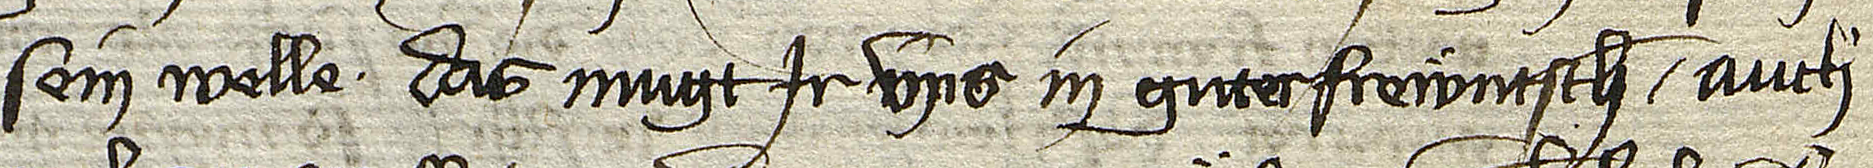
ſein welle . Das mugt Ir vns in guter freẅntſch* / auch
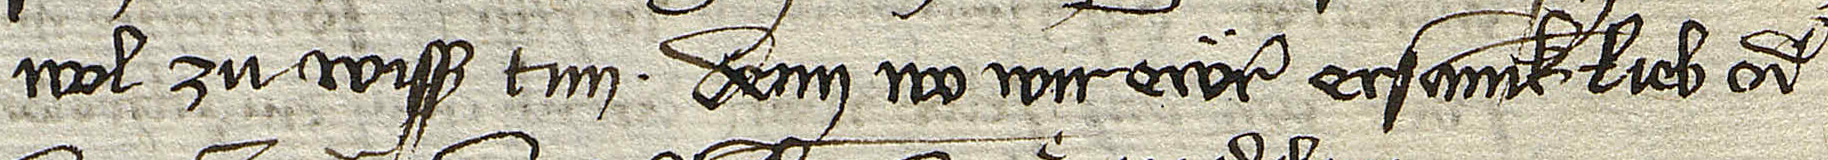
wol ʒu wiſſ* tun Denn wo wir eẅr* erſamk* lieb od*
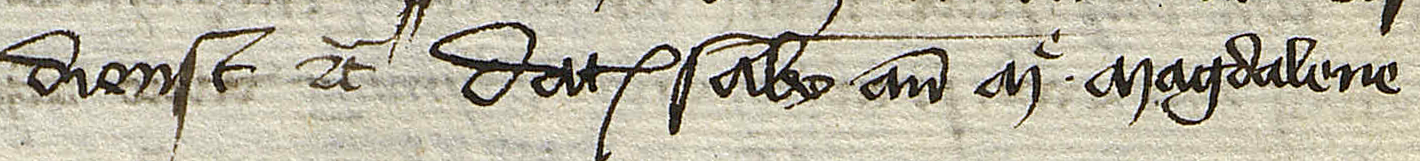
dienſt ec* Dat* ſabo* an* M* . Magdalene
